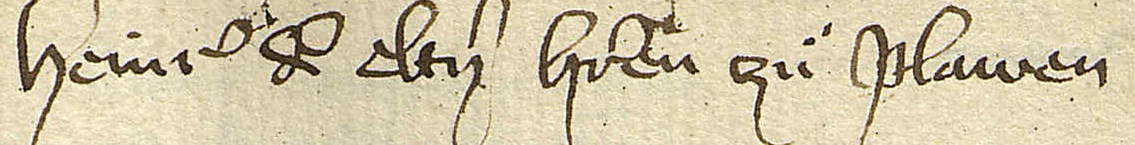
heinr* d* eltn* hr*en cʒü Plawen
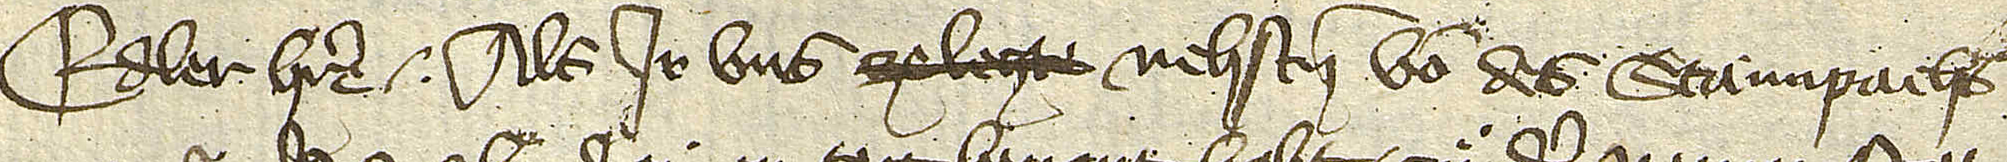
Edler hr*e / . Als Ir vns cʒe lecʒt nehſtn* vo* des Stainpachs
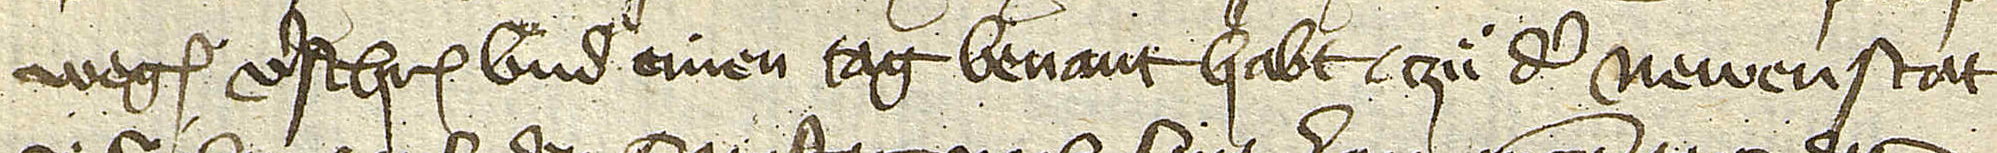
weg* v*ſchr* vnd einen tag benant habt / cʒü d* Newenſtat
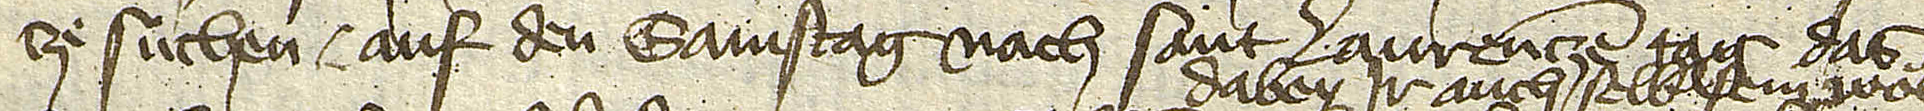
cʒe ſüchen / auf den Samſtag nach ſant Laurencʒe* tag das
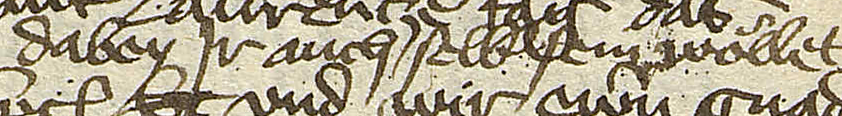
dabey Ir auch ſelb* ſein wöllet
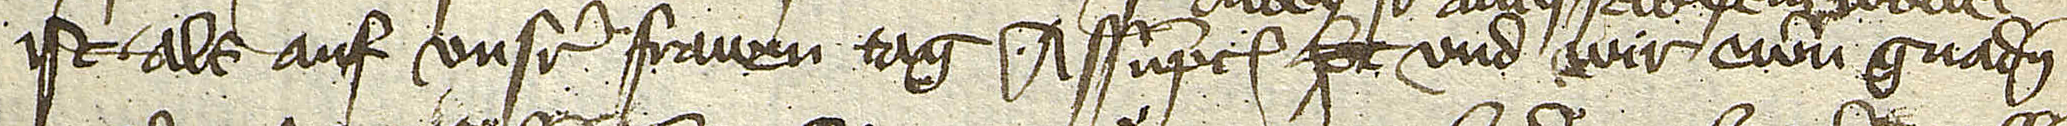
iſt / als auf vnſr* frawen tag Aſſupc* bt vnd wir ewn* gnadn*
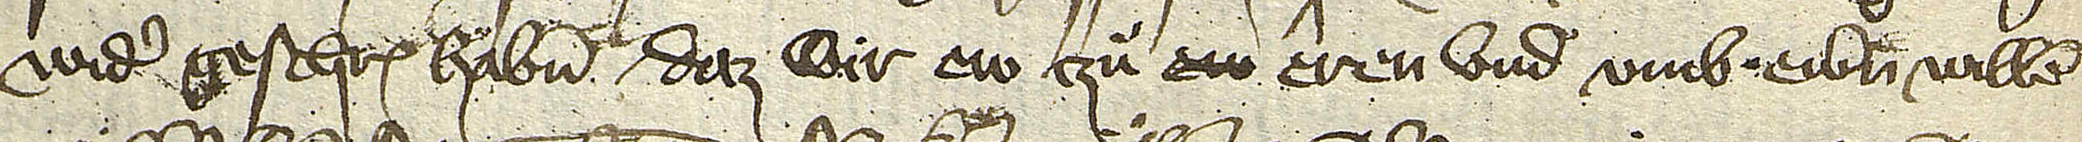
wid* geſchr* habn* / daʒ wir ew cʒü ew eren vnd vmb ew*n wille*
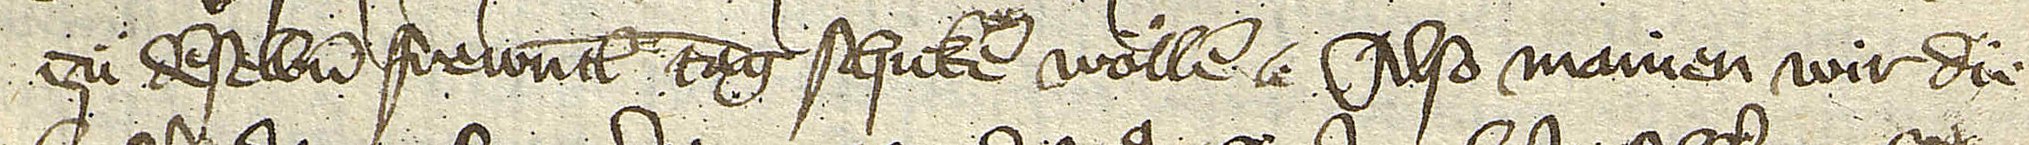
cʒü de*ſelbn* frewntl* tag ſchicke* wölle* / . Alſo mainen wir die
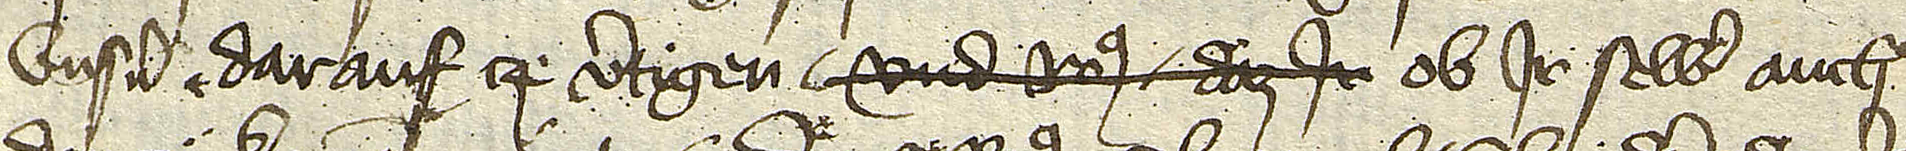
vnſn* darauf cʒe v*tigen / vnd ro* / daʒ Ir ob Ir ſelb* auch
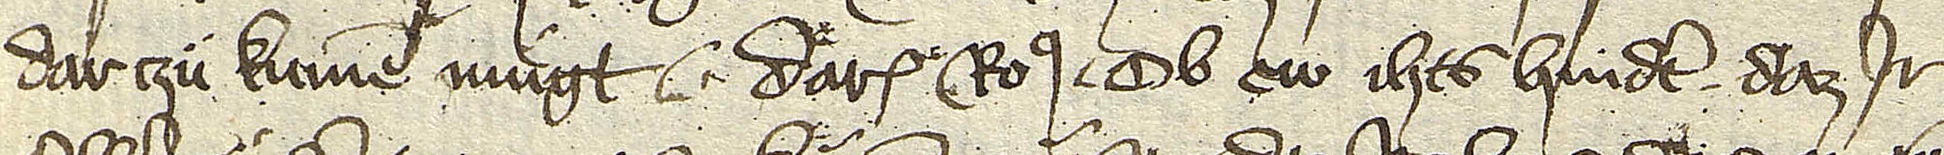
dar cʒü kume* mügt / . Dar* Ro* / Ob ew ihts hindt* daʒ Ir
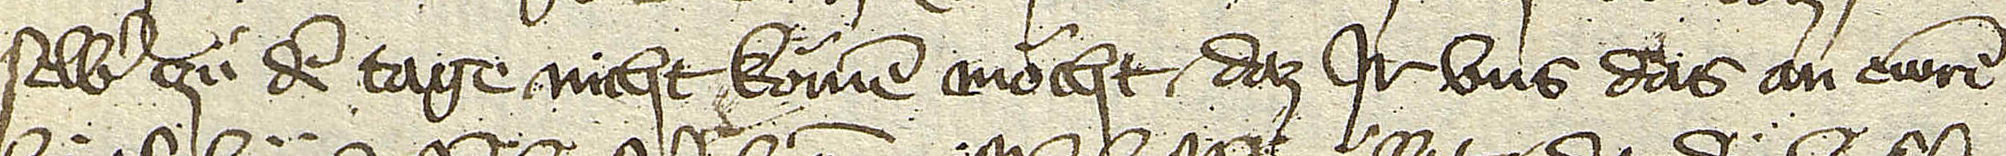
ſelb* cʒü d* tage nicht köme* möcht / daʒ Ir vns das an ewre*
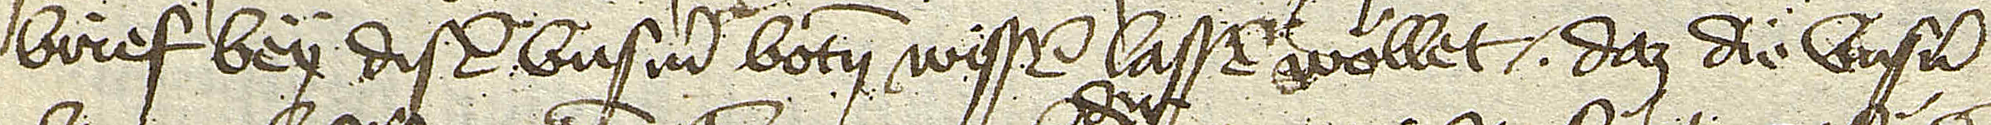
brief bey diſe* vnſm* botn* wiſſe* laſſe* wöllet / . daʒ die vnſn*
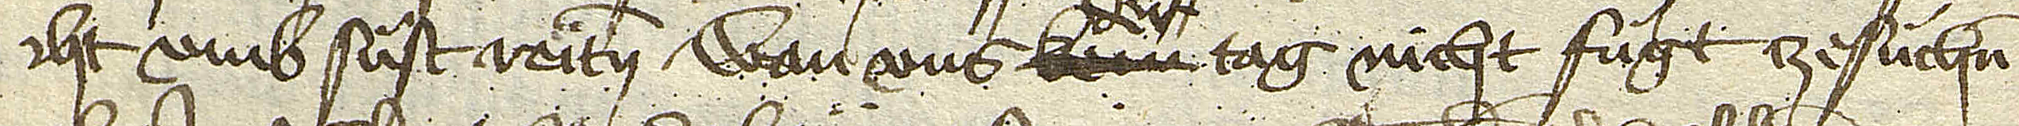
iht vmb ſüſt reitn* / wan vns kein tag nicht fügt cʒeſüchn*
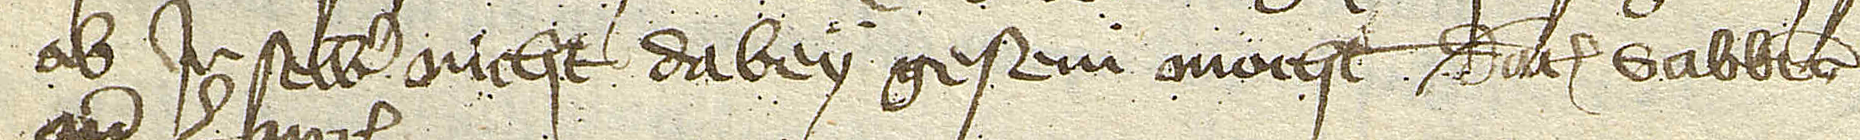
ob Ir ſelb* nicht dabey geſein mocht / dat* Sabbto*
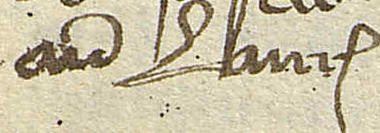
an* Laur*
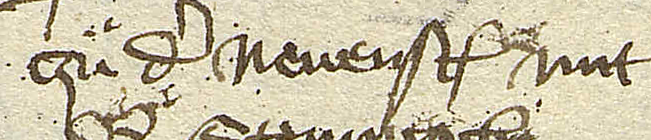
cʒü d* Newenſt* mit
